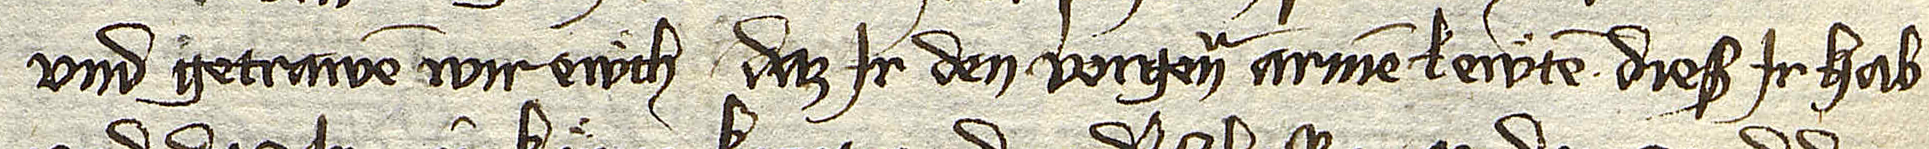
vnd getrawe* wir eẅch / daʒ Ir den vorgen* arme* leẅte* . dieſ* Ir hab
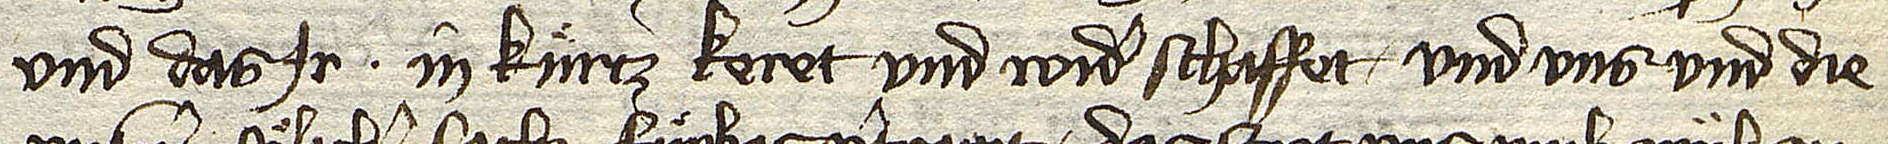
vnd das Ir . in kürcʒ keret vnd wid* ſchaffet / vnd vns vnd die
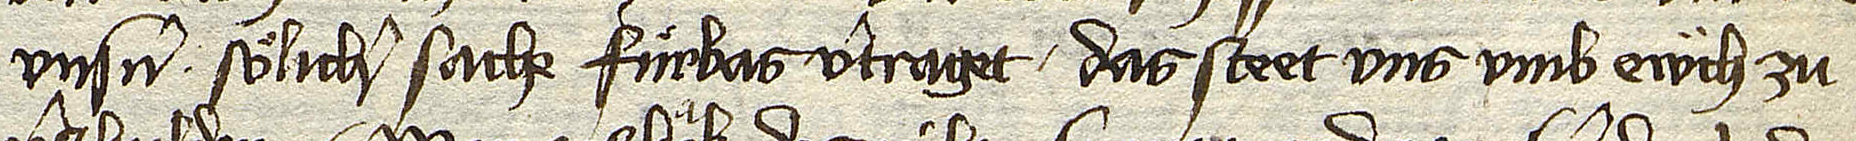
vnſ*n . ſölich* ſache fürbas v*traget / das ſteet vns vmb eẅch ʒu
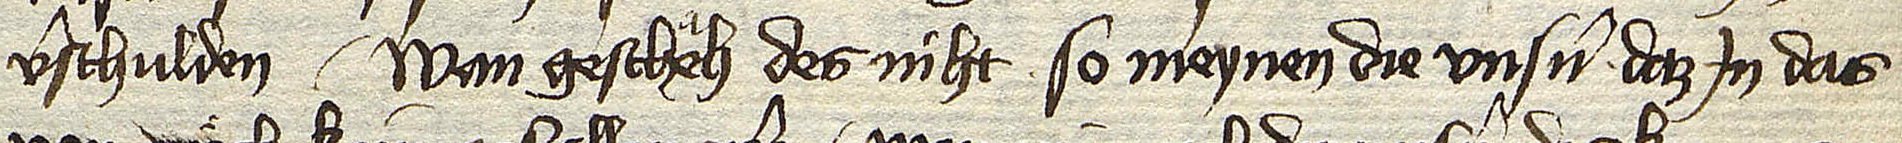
v*ſchulden / Wan geſchëh des niht . ſo meynen die vnſ*n . daʒ In das
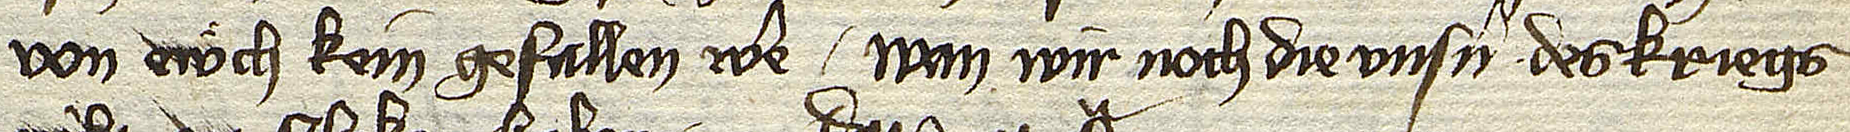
von ewch kein gefallen we* / wan wir noch die vnſ*n . des kriegs
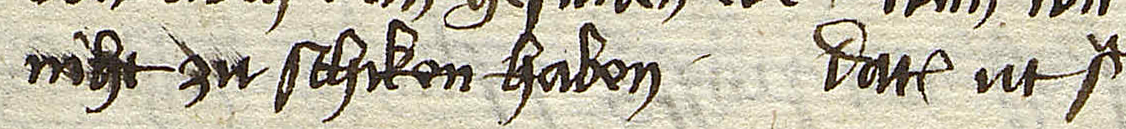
niht ʒu ſchiken haben / dat* ut ſ*
